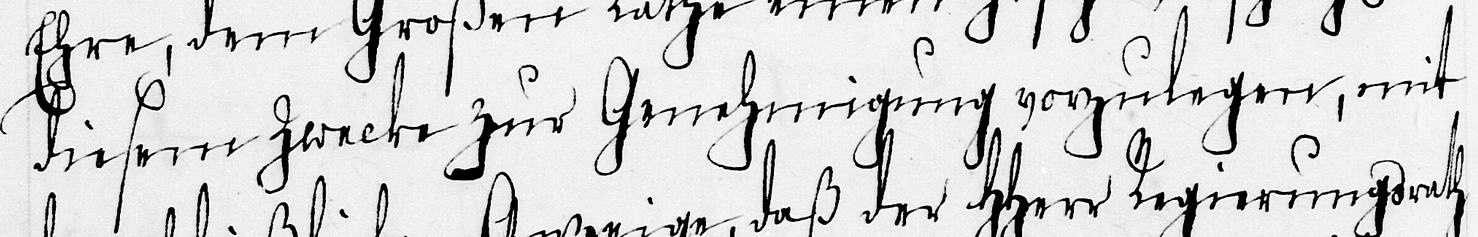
diesem Zwecke zur Genehmigung vorzulegen, mit
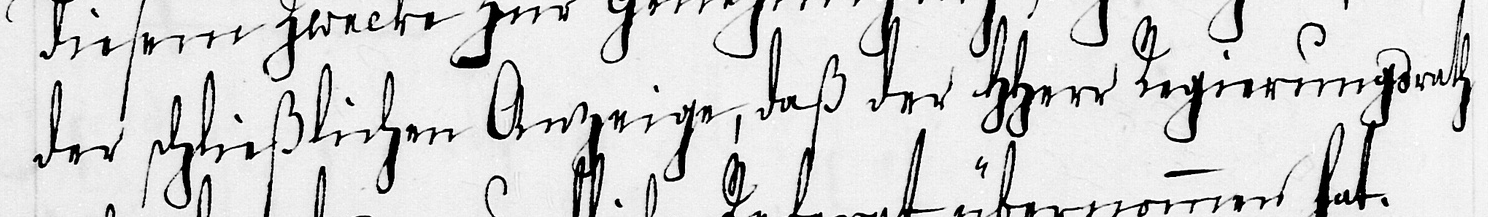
der schließlichen Anzeige, daß der HHerr Regierungsrath
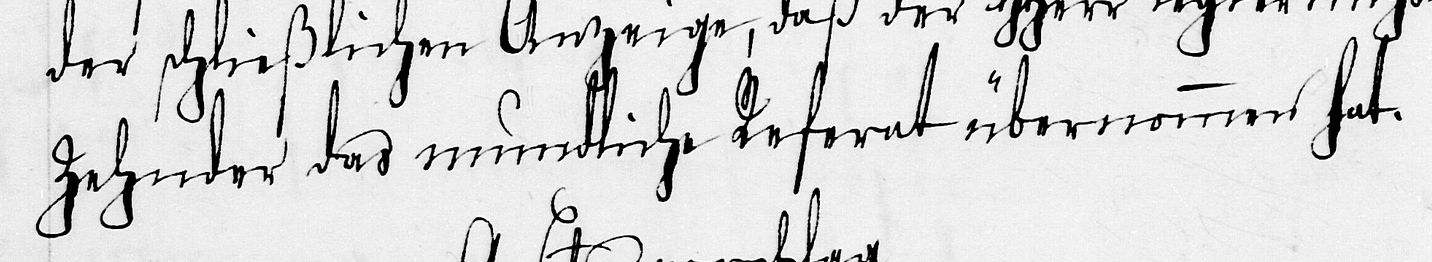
Zehnder das mundliche Referat übernommen hat.
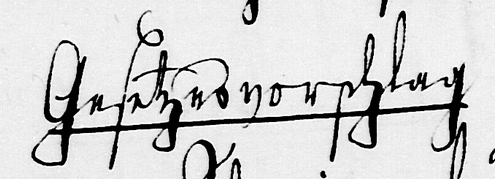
Gesetzesvorschlag
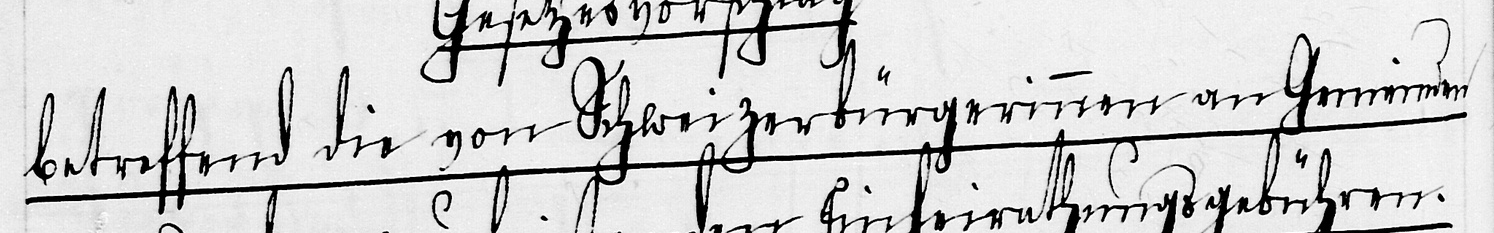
betreffend die von Schweizerbürgerinnen an Gemeinden
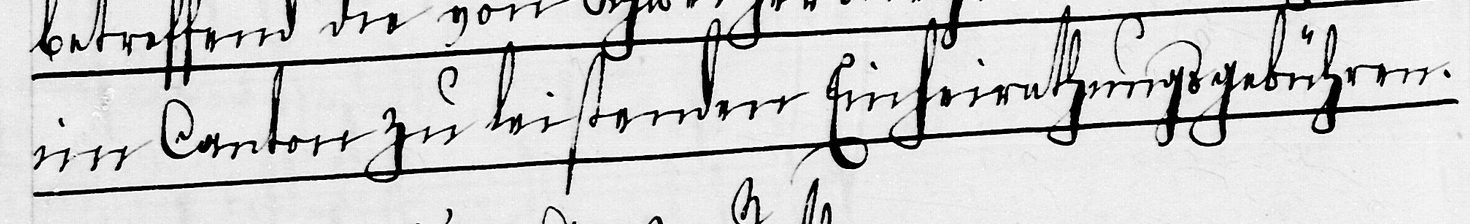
im Canton zu leistenden Einheirathungsgebühren.
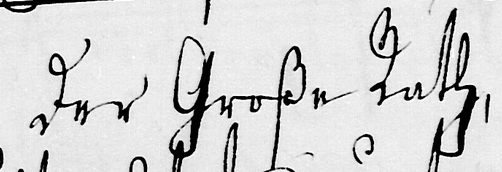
Der Große Rath,
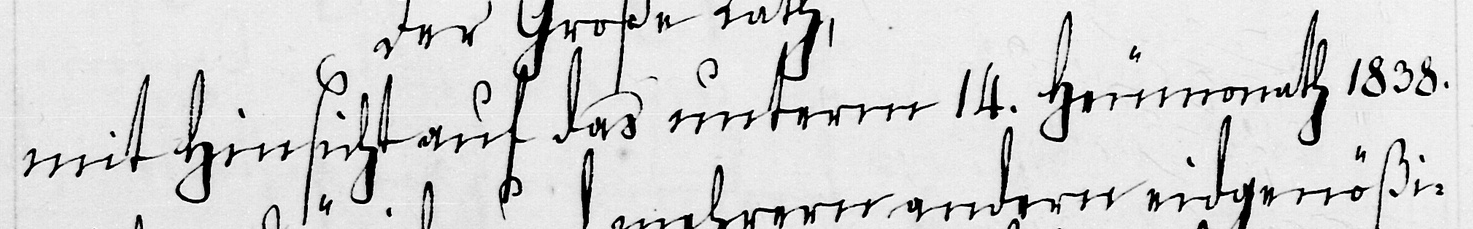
mit Hinsicht auf das unterm 14. Heumonath 1838.
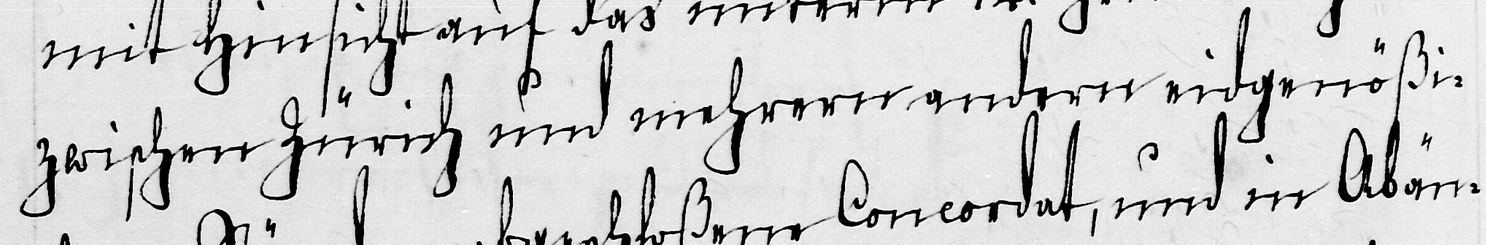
zwischen Zürich und mehrern andern eidgenößi¬
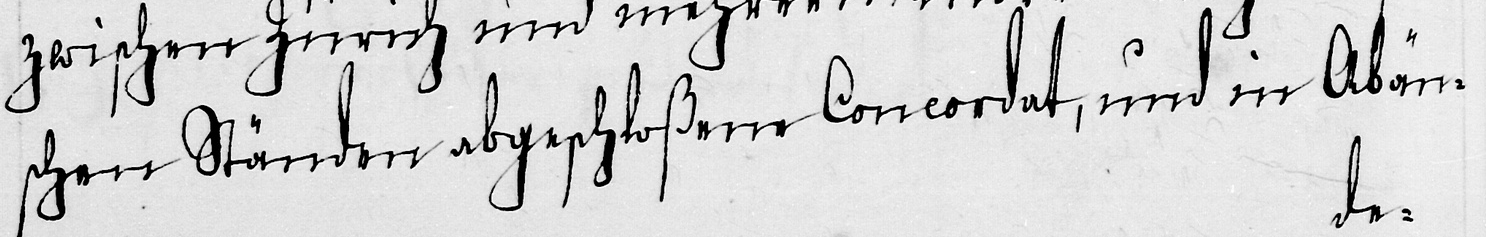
schen Ständen abgeschloßene Concordat, und in Abän-
